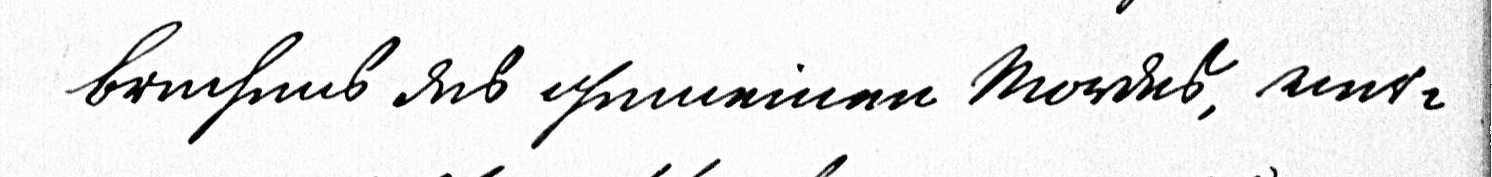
brechens des gemeinen Mordes, ver¬
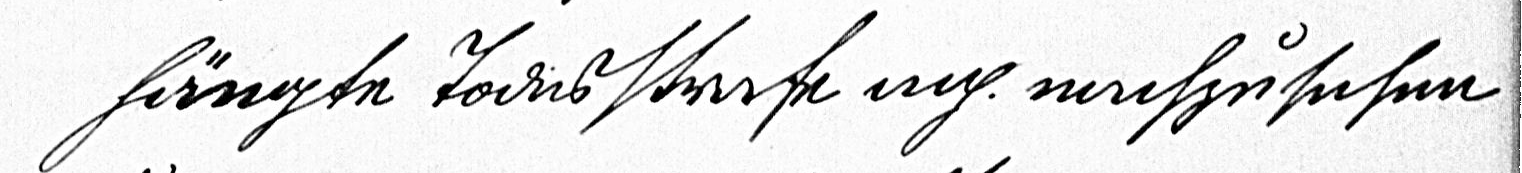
hängte Todesstrafe ag. nachzusehen
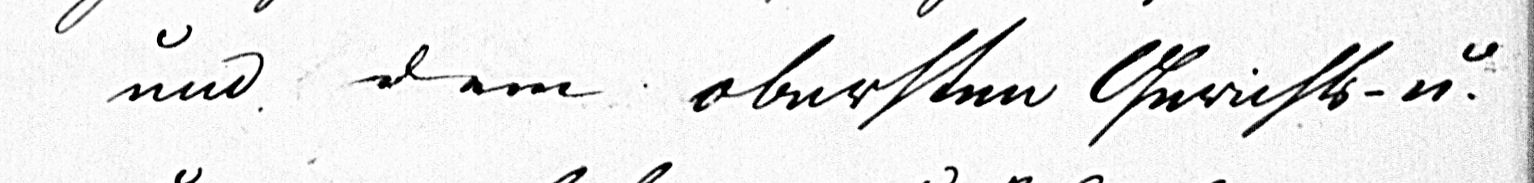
und dem obersten Gerichts- u.
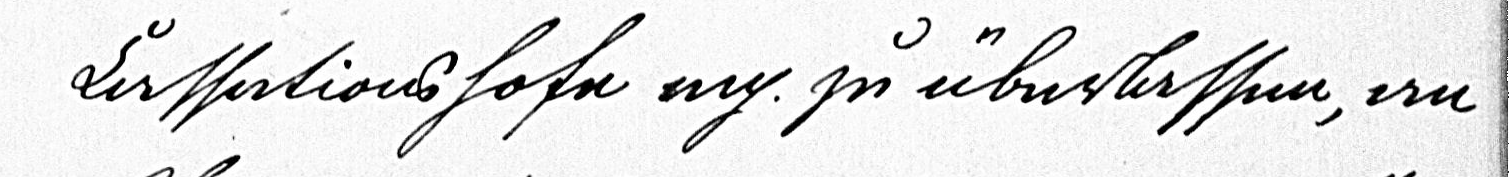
Cassationshofe ag. zu überlassen, an
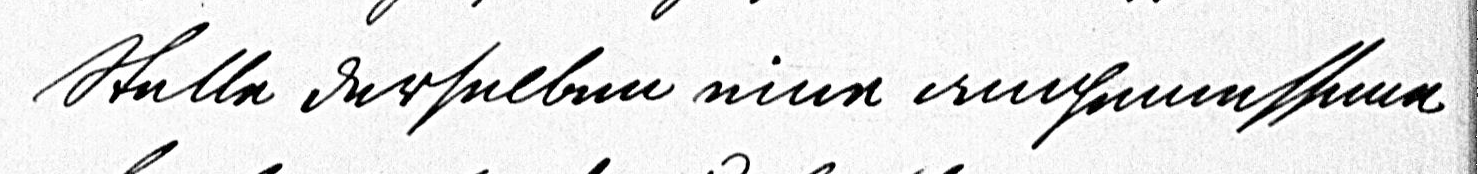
Stelle derselben eine angemessene
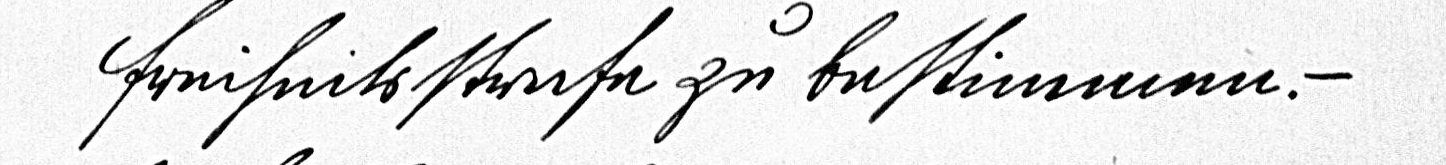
Freiheitsstrafe zu bestimmen.-
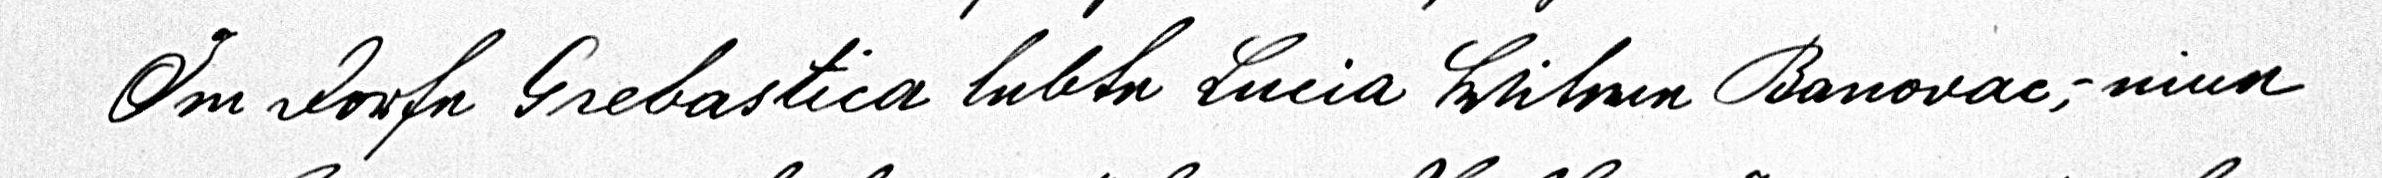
Im Dorfe Grebsatica lebte Lucia Witwe Banovac,- eine
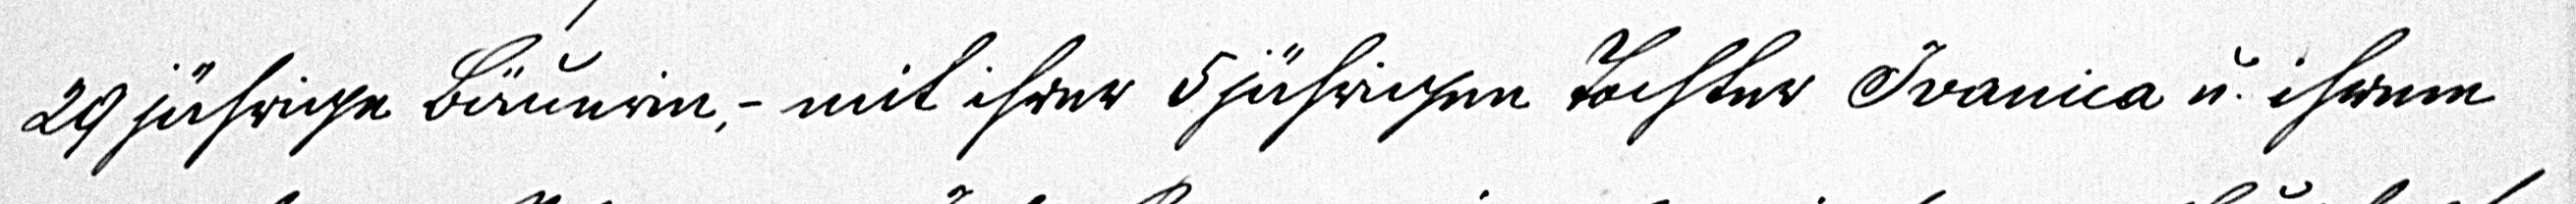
29 jährige Bäuerin,- mit ihrer 5 jährigen Tochter Ivanica u. ihrem
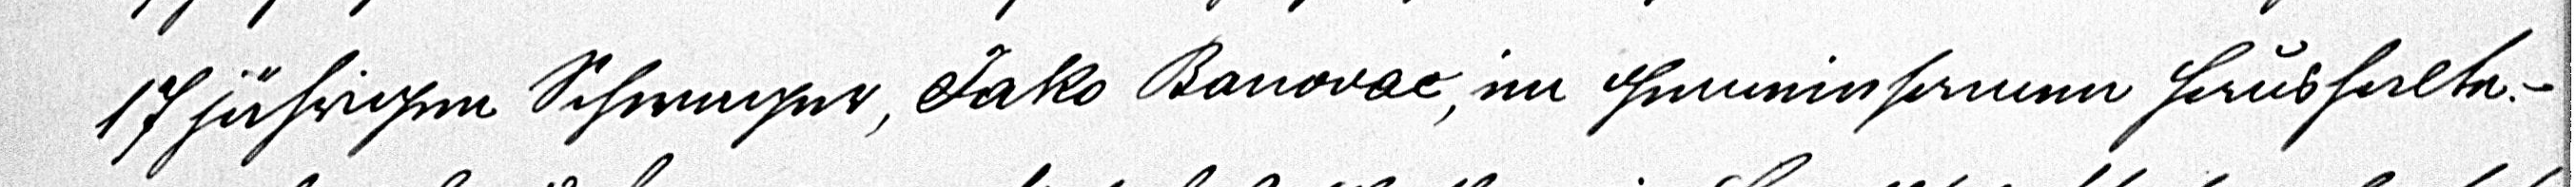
17 jährigen Schwager, Jako Banovac, im gemeinsamen haushalte.-
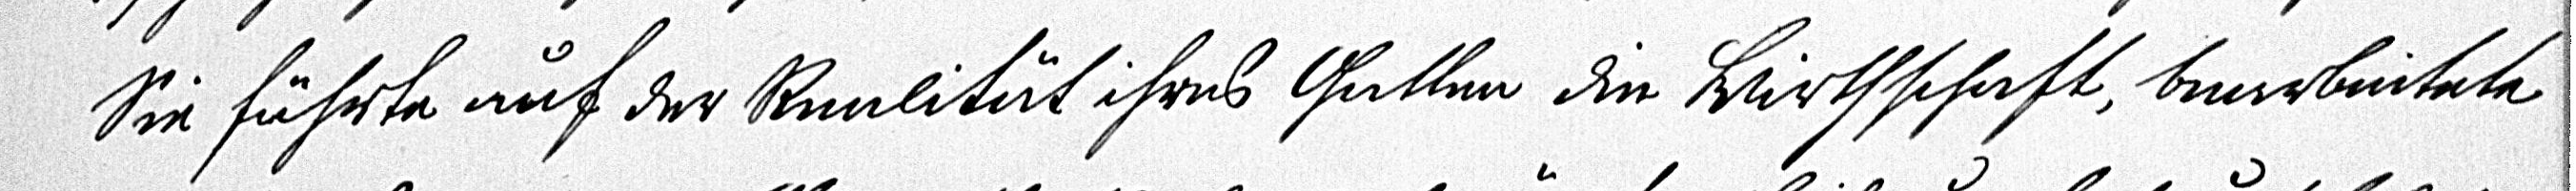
Sie führte auf der Realität ihres Gallen die Wirthschaft, bearbeitete
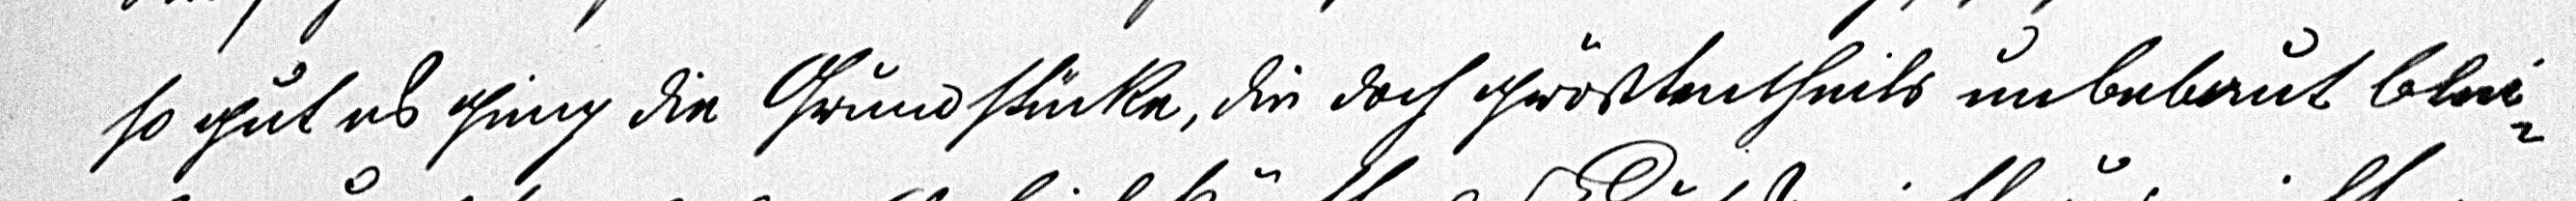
so gut es ging die Grundstücke, die doch größtentheils unbebaut blei¬
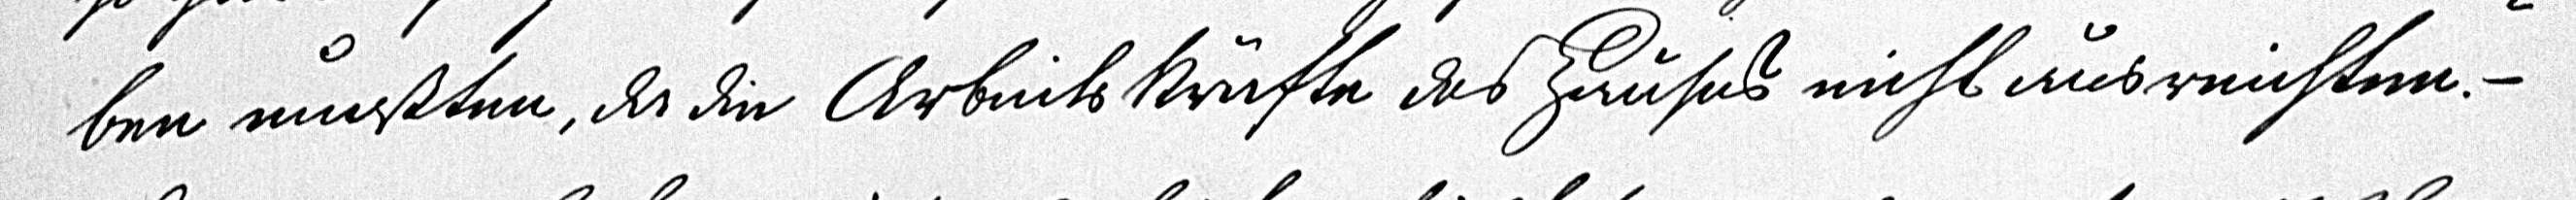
ben mußten, da die Arbeitskräfte des Hauses nicht ausreichten.-
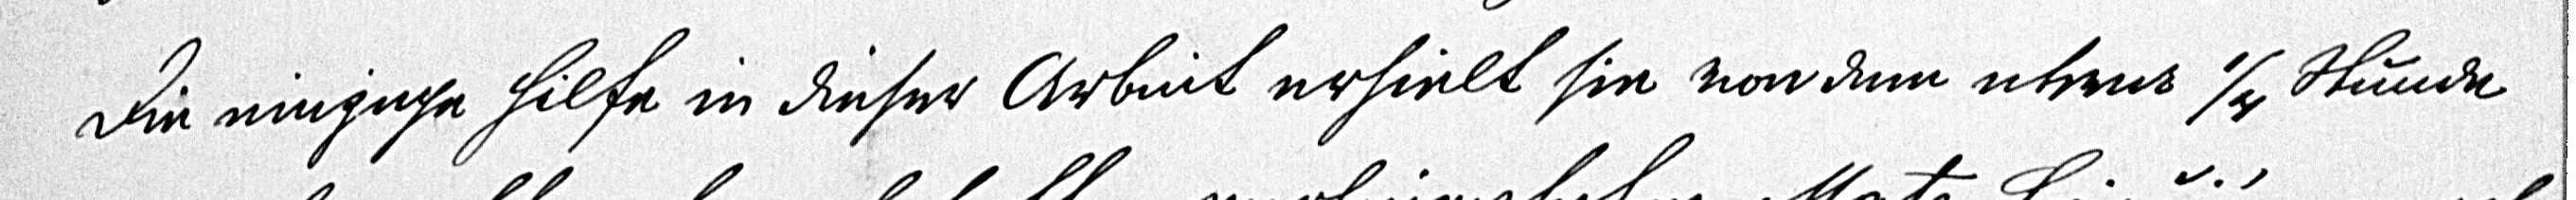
Die einzige Hilfe in dieser Arbeit erhielt sie von dem etwa ¼ Stunde
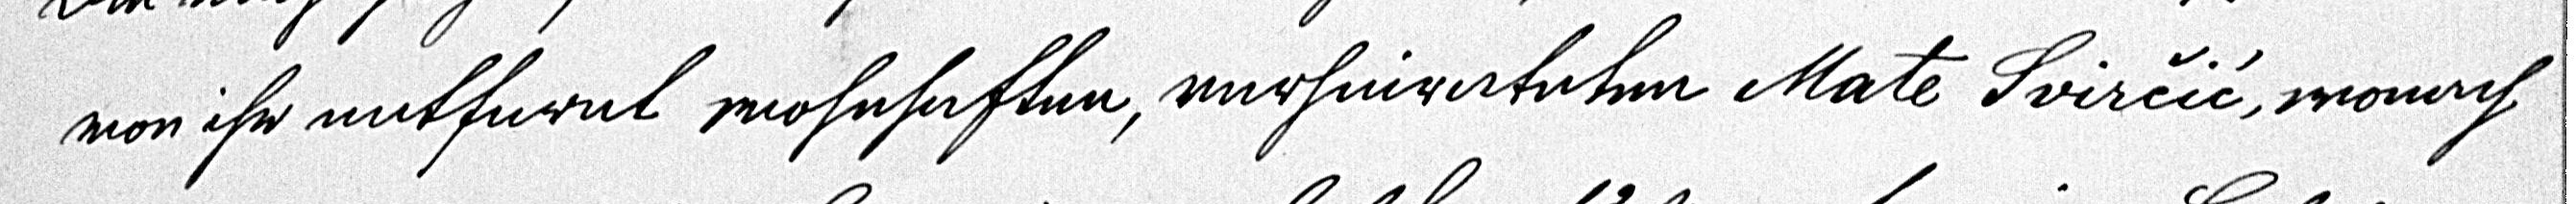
von ihr entfernt wohnhaften, verheirateten Mate Svirčić, wonach
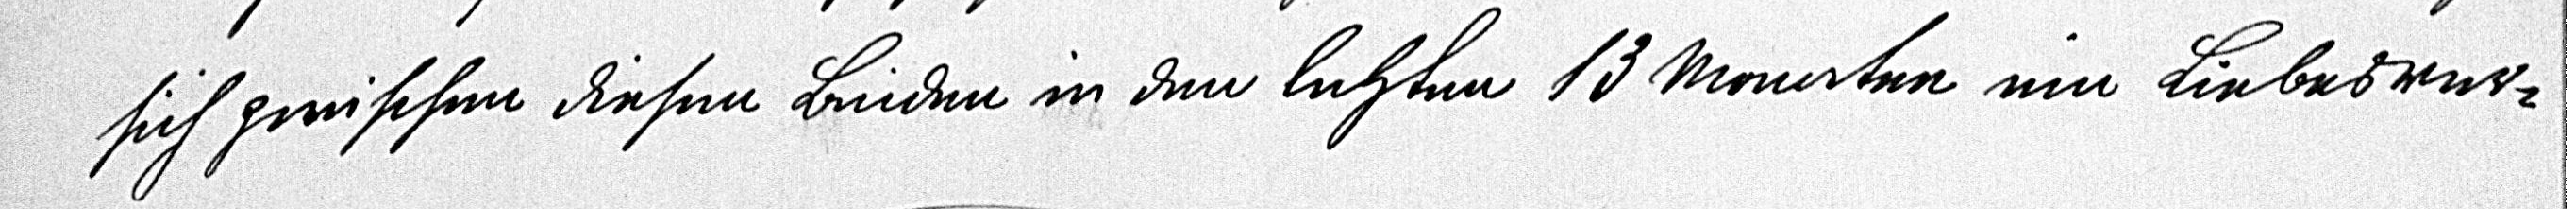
sich zwischen diesen Beiden in den letzten 13 Monaten ein Liebesver¬
